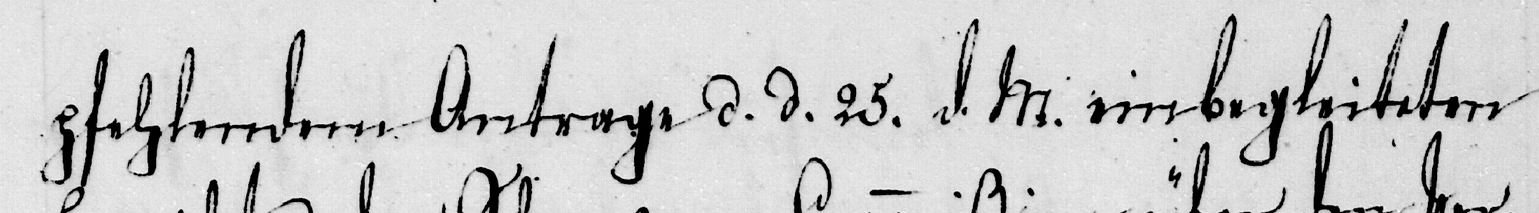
pfehlendem Antrage d. d. 25. d. M. einbegleiteten
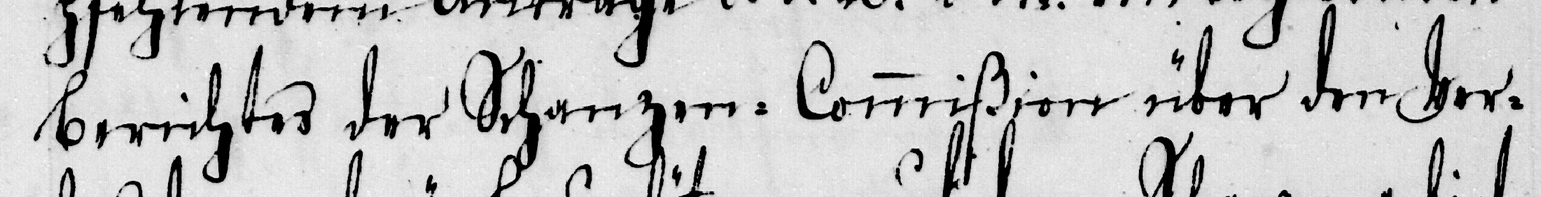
Berichtes der Schanzen-Commißion über den Ver¬
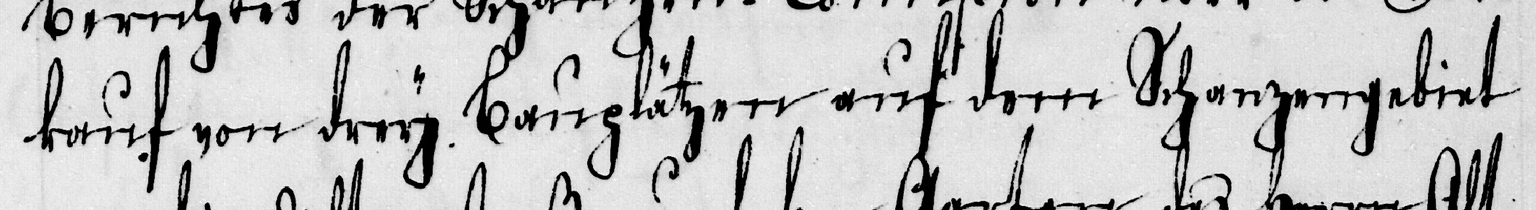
kauf von drey Bauplätzen auf dem Schanzengebiet
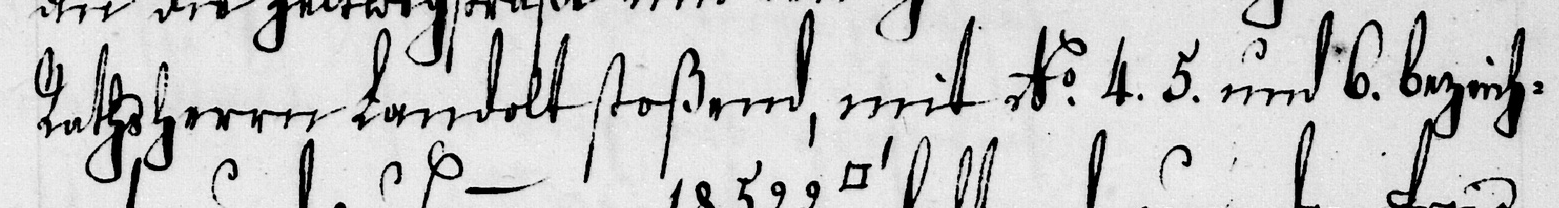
athsherrn Landolt stoßend, mit No. 4. 5. und 6. bezeic¬
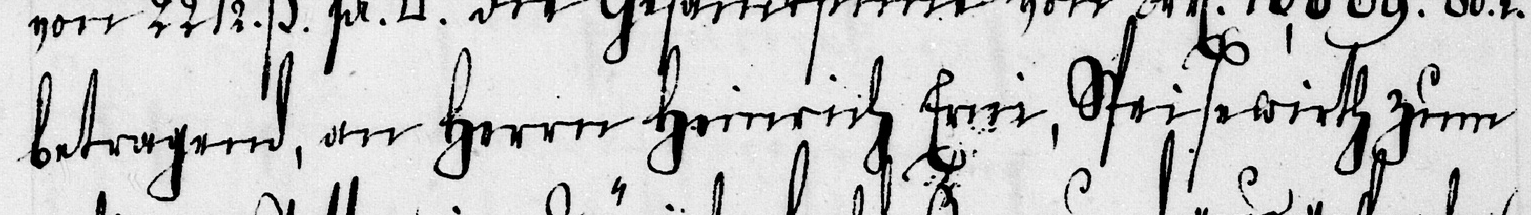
betragend, an Herrn Heinrich Erni, Speisewirth zum
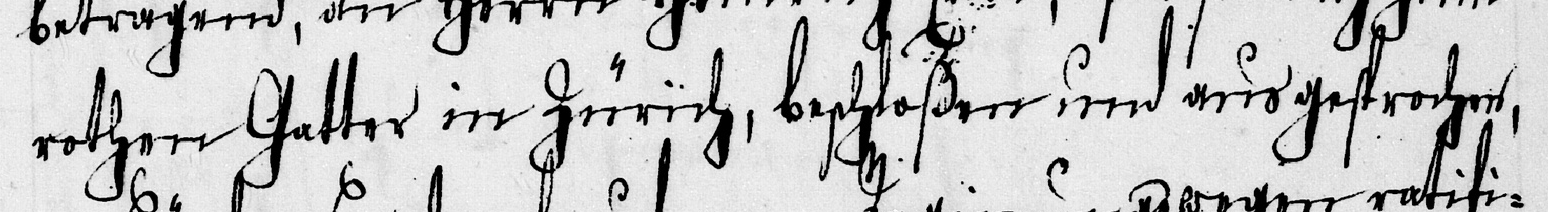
rothen Gatter in Zürich, beschloßen und ausgesprochen,
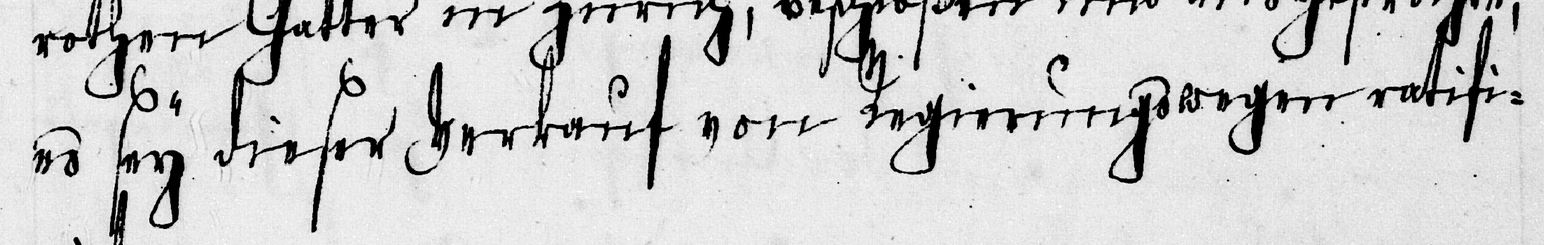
es sey dieser Verkauf von Regierungswegen ratifi¬
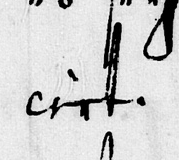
cirt.
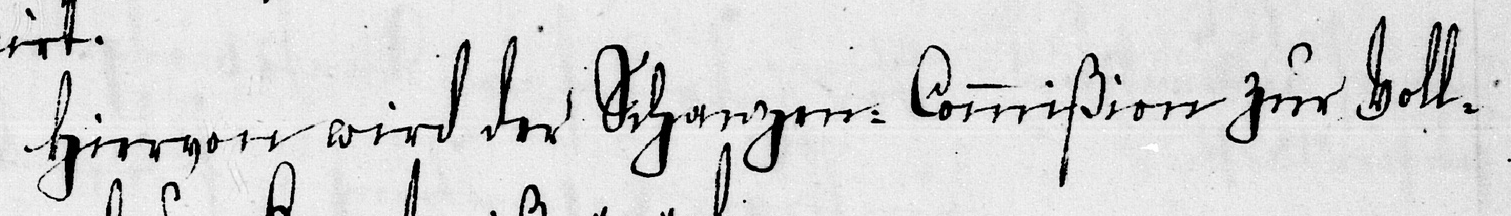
Hiervon wird der Schanzen-Commißion zur Voll¬
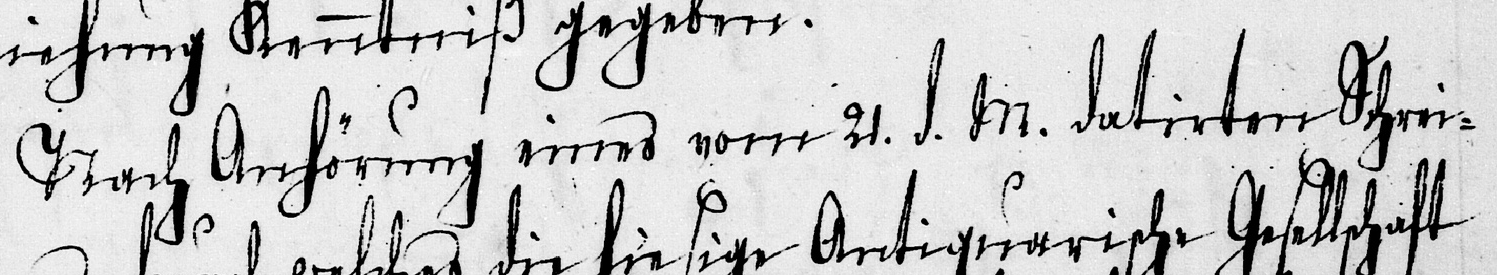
Nach Anhörung eines vom 21. d. M. datirten Schrei¬
